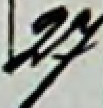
27
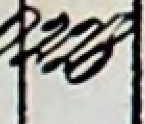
228
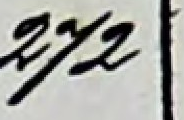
272
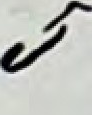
5
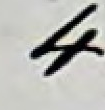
4
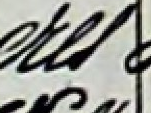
Alt
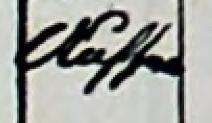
Aussee
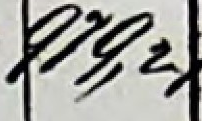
979,2
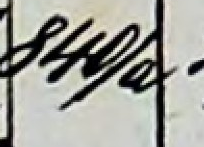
840/a
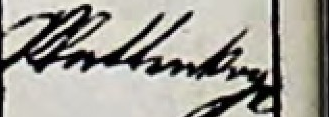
Plattenkogl
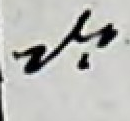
Do
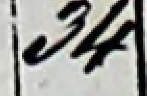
34
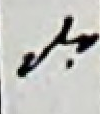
Do
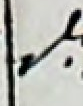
Do
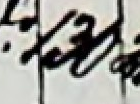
130
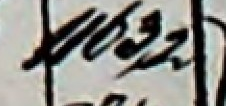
1163,2
